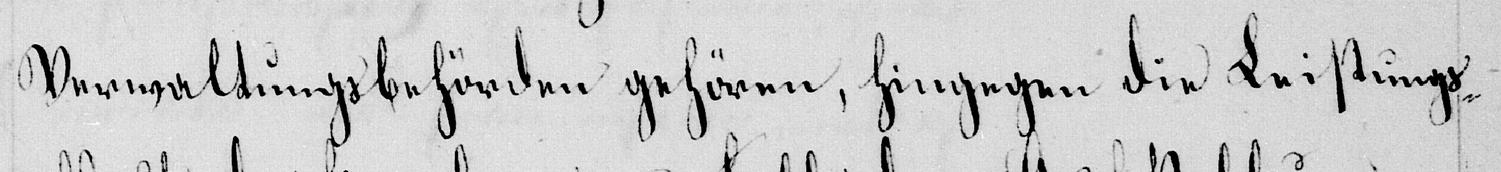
Verwaltungsbehörden gehören, hingegen die Leistungs¬
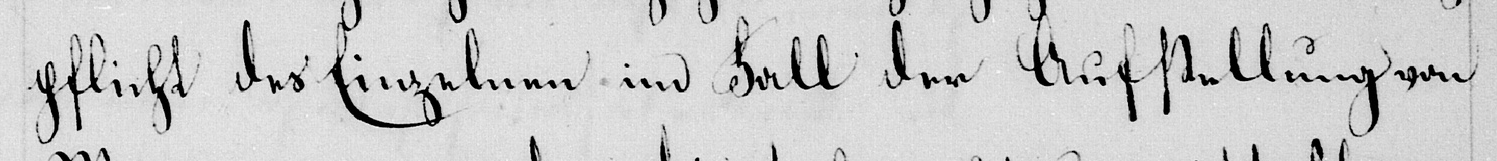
pflicht des Einzelnen im Fall der Aufstellung von
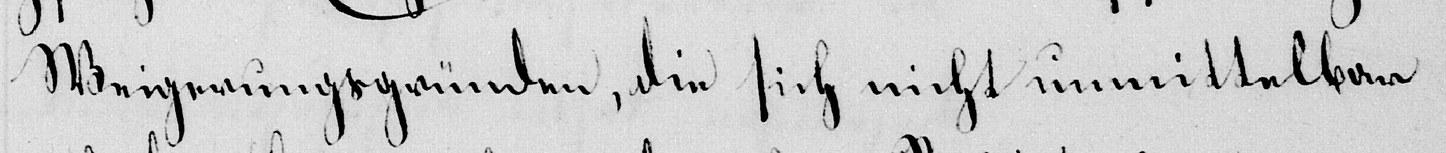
Weigerungsgründen, die sich nicht unmittelbar
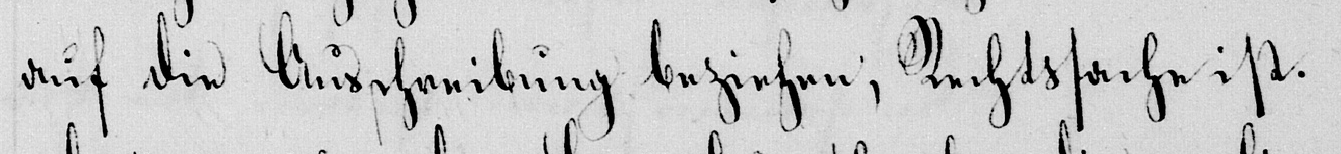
auf die Ausschreibung beziehen, Rechtssache ist.
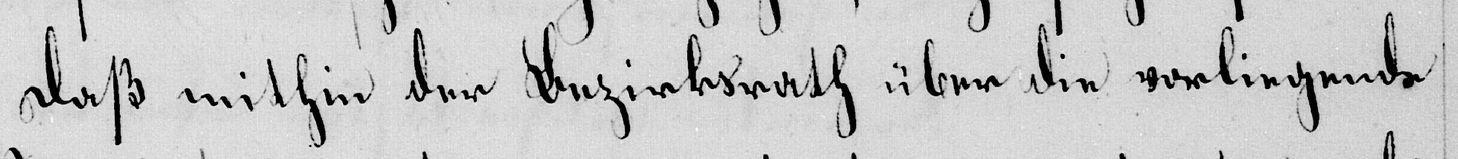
Daß mithin der Bezirksrath über die vorliegende
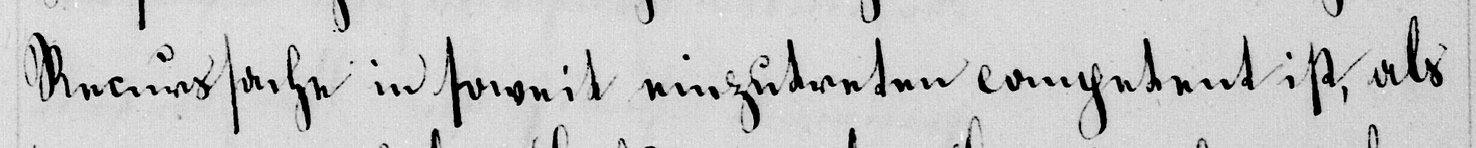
Recurssache in soweit einzutreten competent ist, als
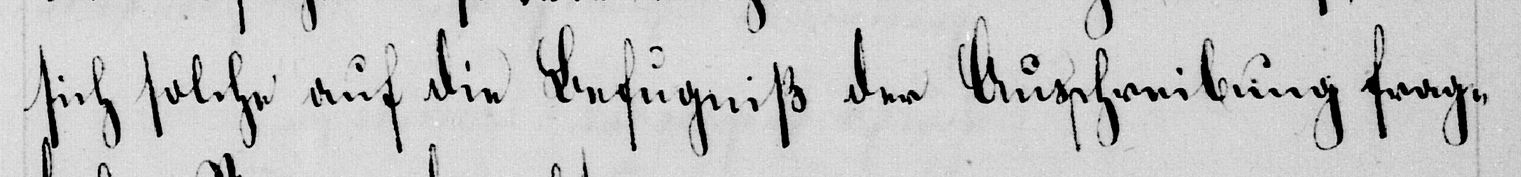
sich solche auf die Befugniß der Ausschreibung frag¬
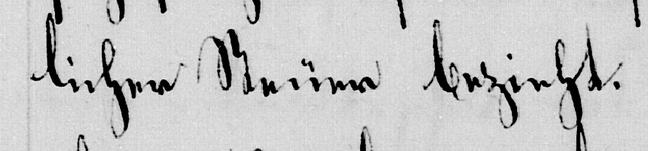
licher Steuer bezieht.
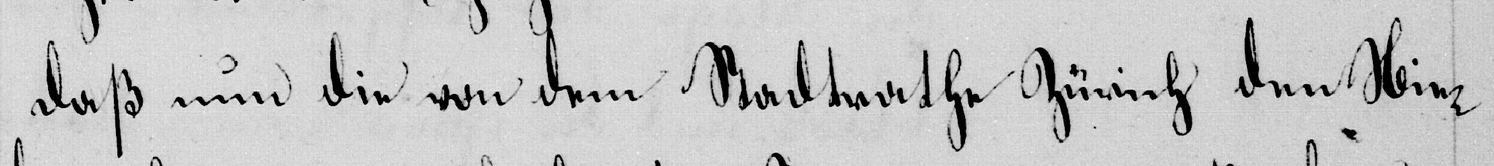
Daß nun die von dem Stadtrathe Zürich den Nie¬
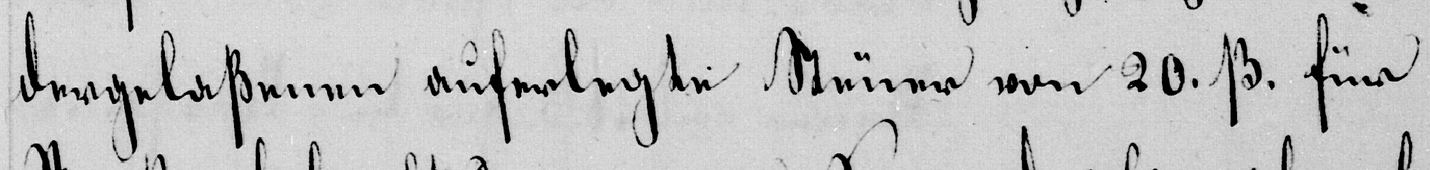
dergelaßenen auferlegte Steuer von 20. ß. für
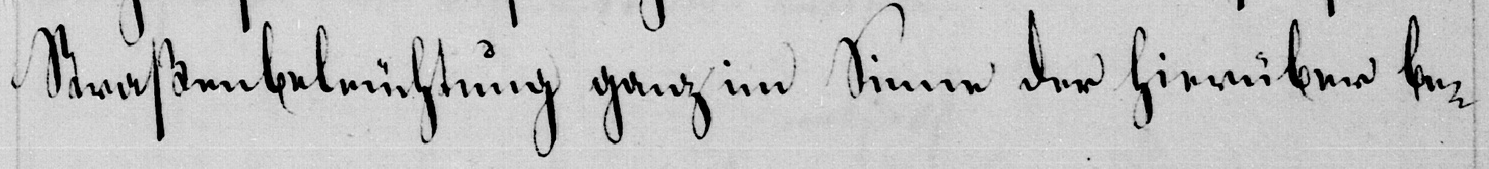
Straßenbeleuchtung ganz im Sinne der hierüber be-
